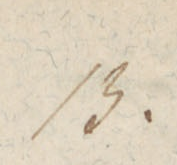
13.
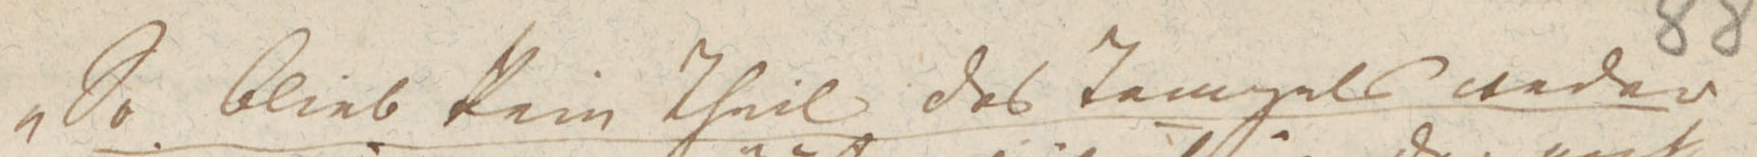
"So blieb kein Theil des Tempels weder
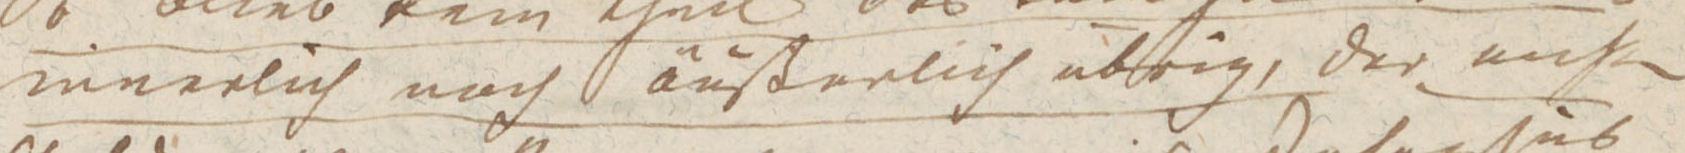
innerlich noch äusserlich übrig, der nicht
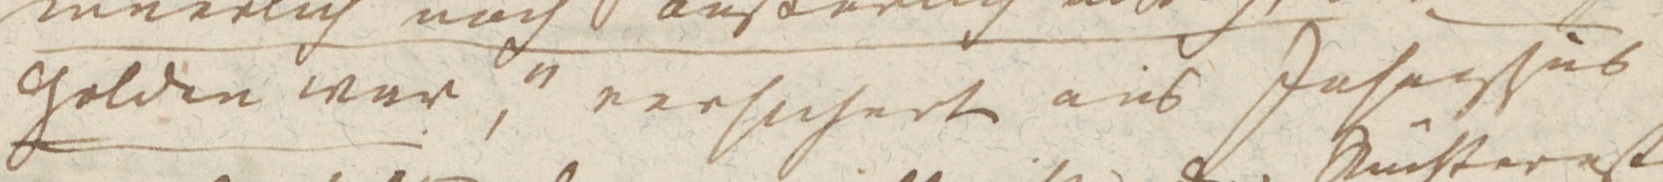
golden war," versichert und Josephus
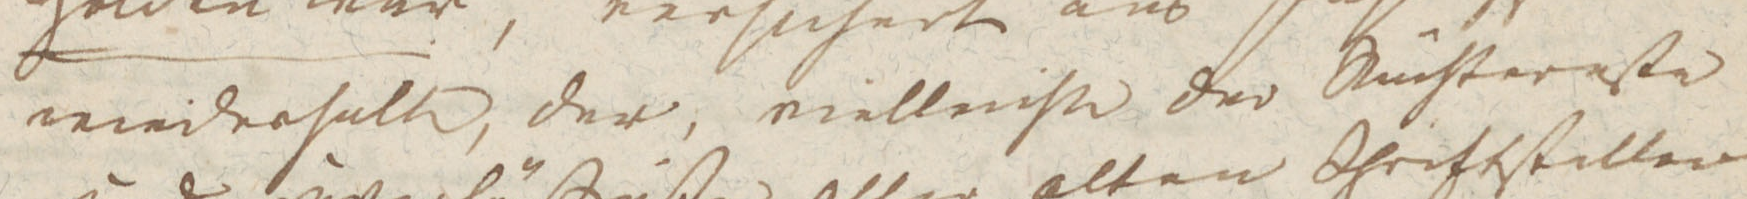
wiederholt, der, vielleicht der Nüchternste
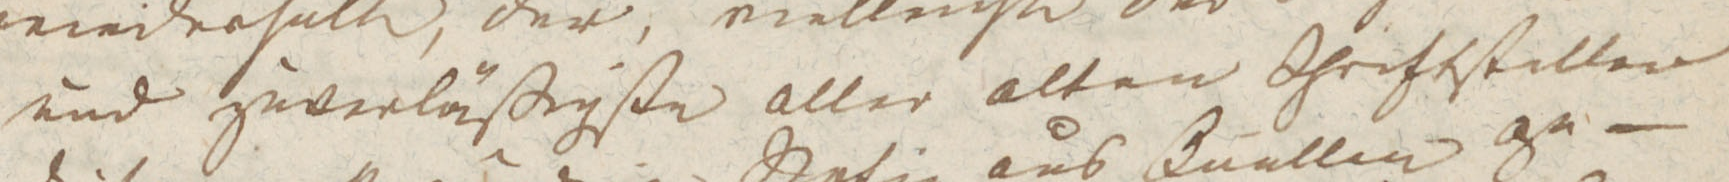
und zuverlässigste aller alten Schriftsteller
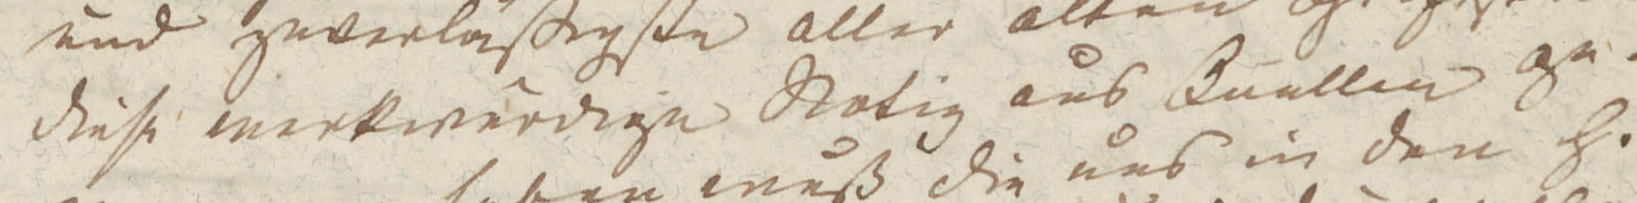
diese merkwürdige Notiz aus Quellen ge-
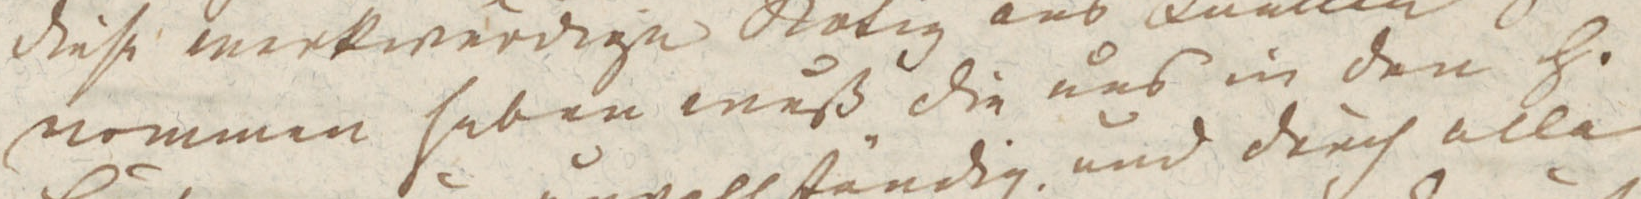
nommen haben muss die uns in den H.
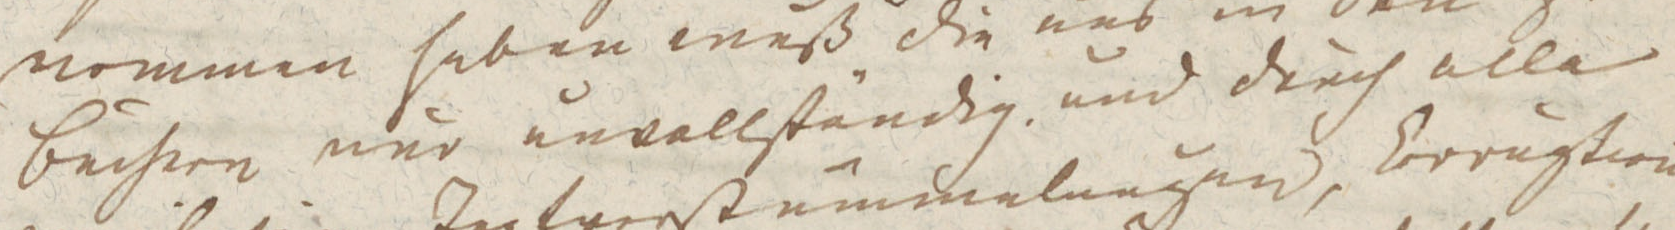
Büchern nur unvollständig und durch alle
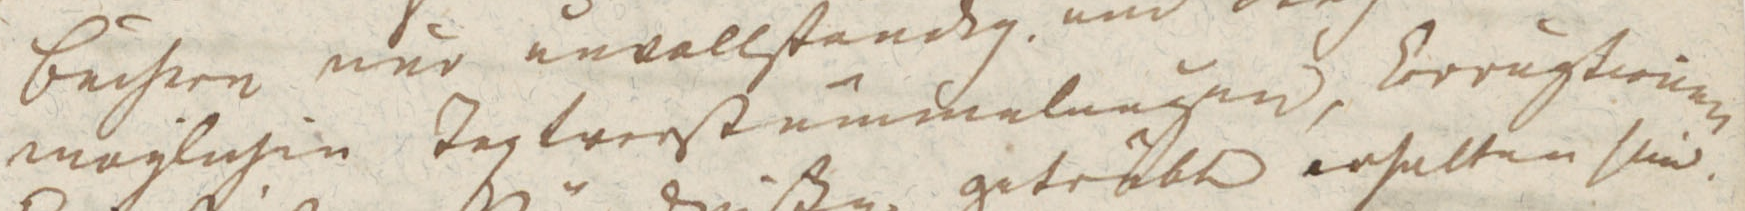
möglichen Textverstümmelungen, Corruptionen
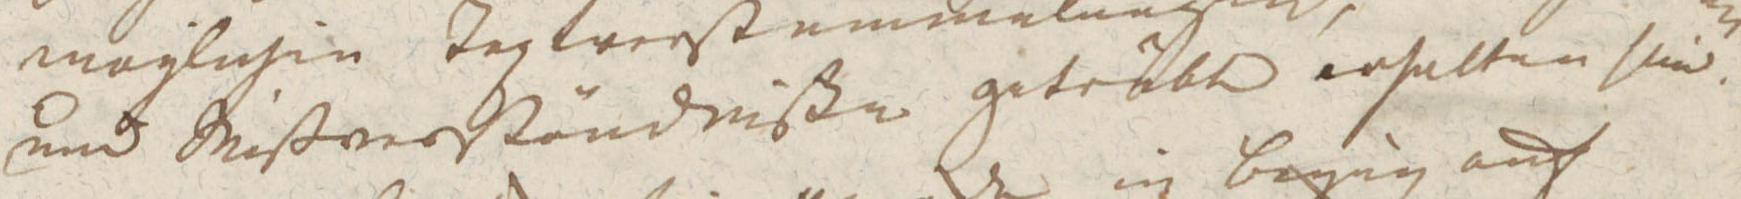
und Missverständnisse getrübt erhalten sind.
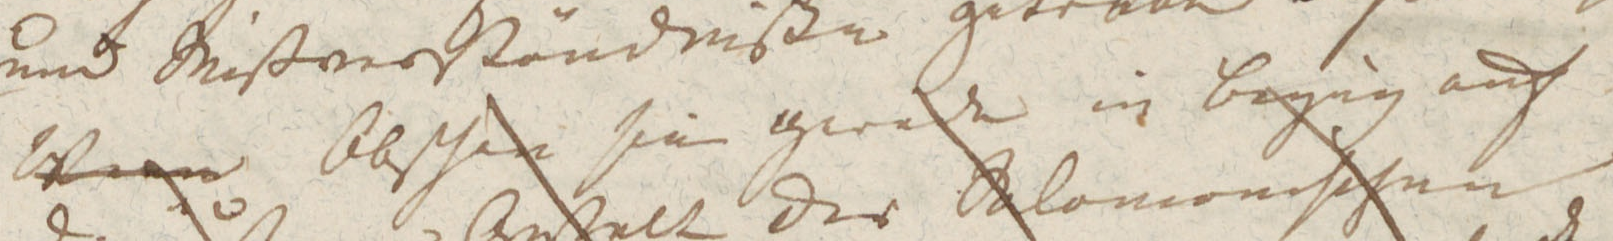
Wenn Obschon sie gerade in Bezug auf
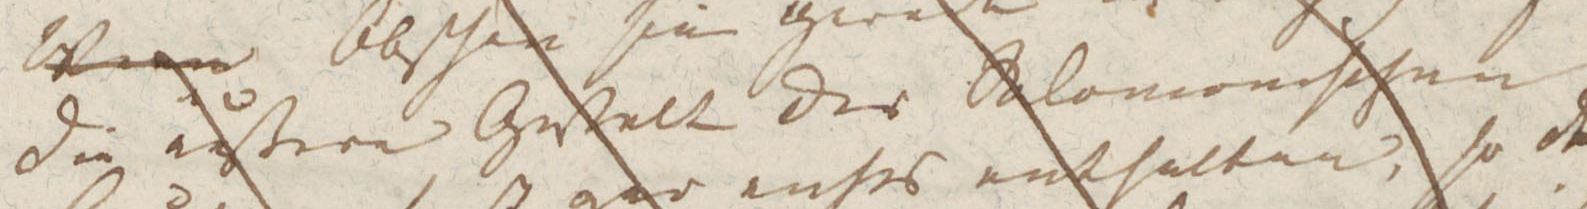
die äussere Gestalt der Salomonischen
